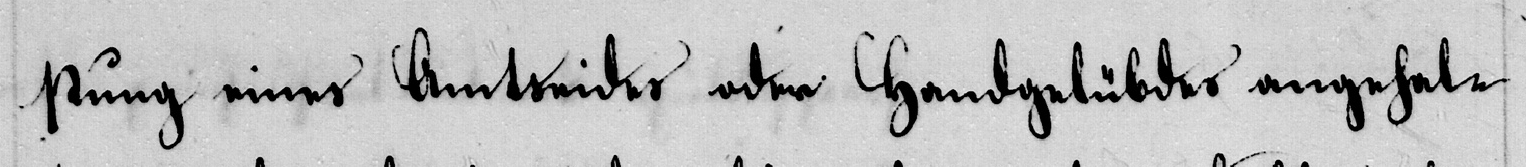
stung eines Amtseides oder Handgelübdes angehal¬
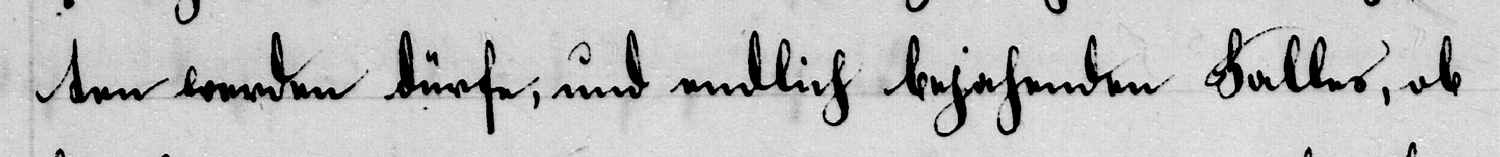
ten werden dürfe, und endlich bejahenden Falles, ob
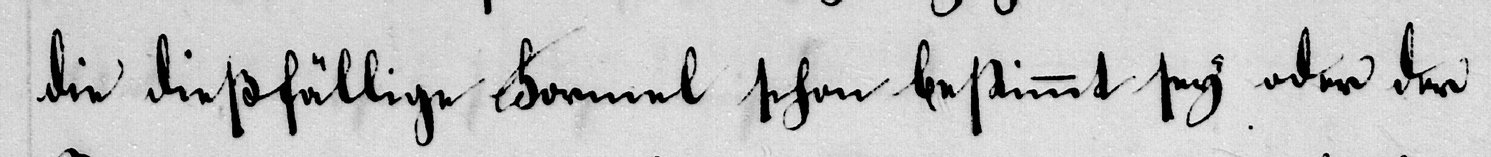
die dießfällige Formel schon bestimmt sey oder der
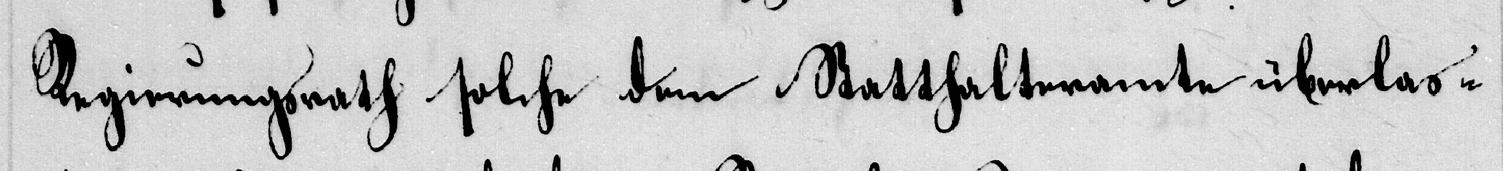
Regierungsrath solche dem Statthalteramte überlaß¬
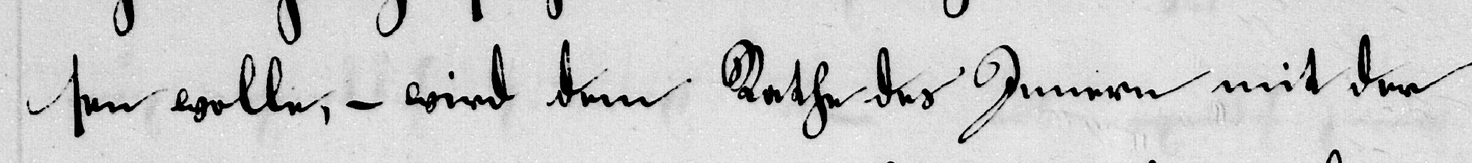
en wolle, – wird dem Rathe des Innern mit der
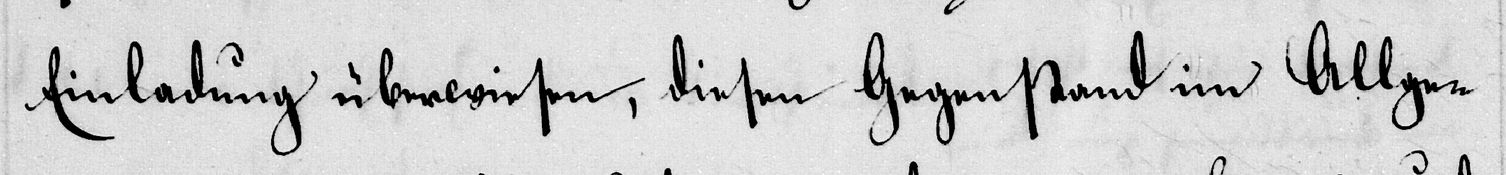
Einladung überwiesen, diesen Gegenstand im Allge¬
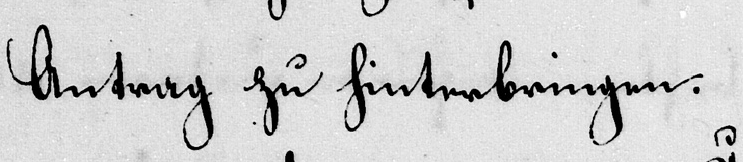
Antrag zu hinterbringen.
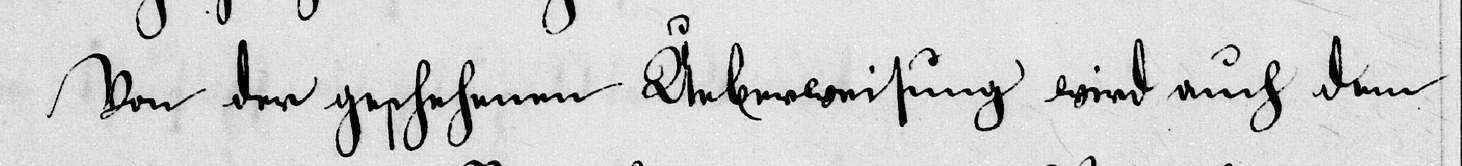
Von der geschehenen Ueberweisung wird auch dem
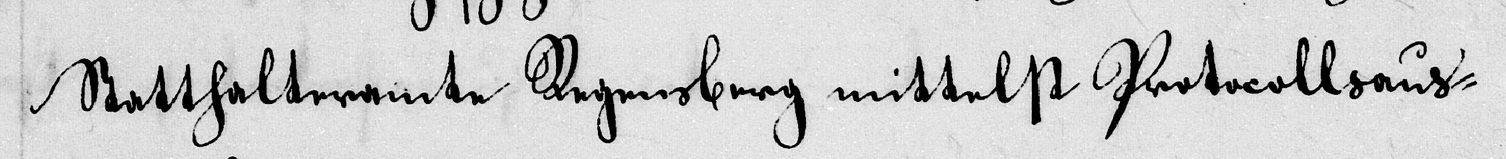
Statthalteramte Regensberg mittelst Protocollsaus¬
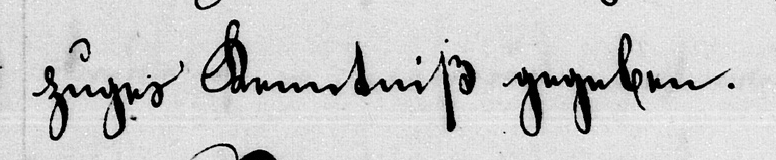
zuges Kenntniß gegeben.
